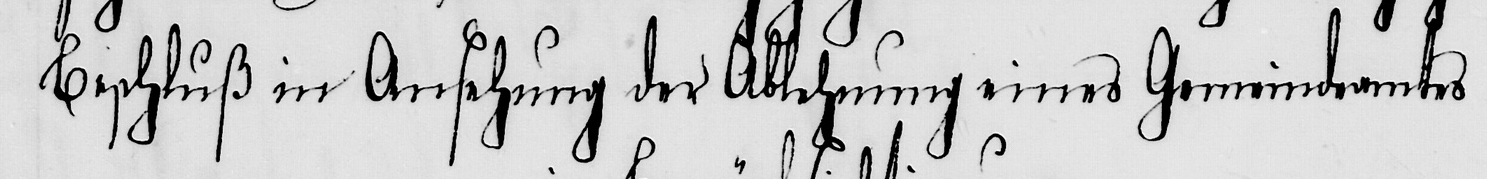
Beschluß in Ansehung der Ablehnung eines Gemeindamtes
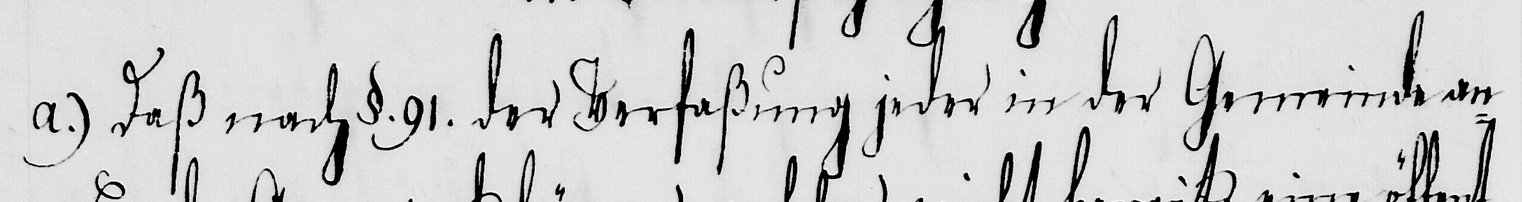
a.) Daß nach §. 91. der Verfaßung jeder in der Gemeinde an¬
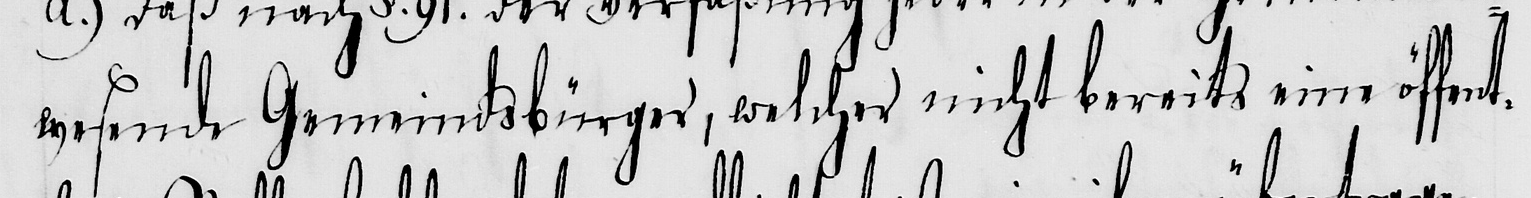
wesende Gemeindsbürger, welcher nicht bereits eine öffen¬
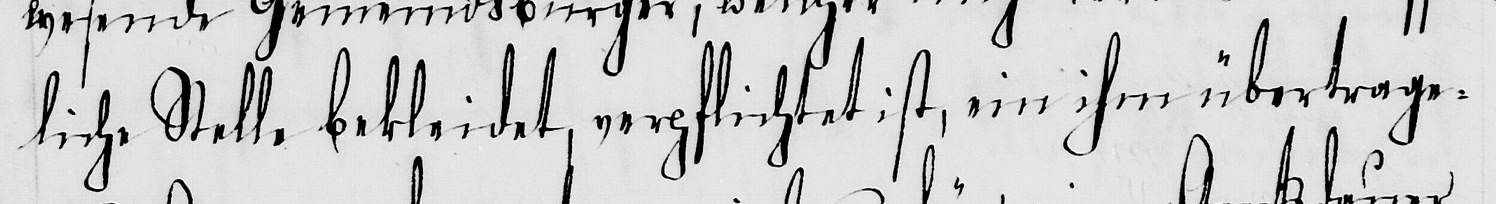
liche Stelle bekleidet, verpflichtet ist, ein ihm übertrage¬
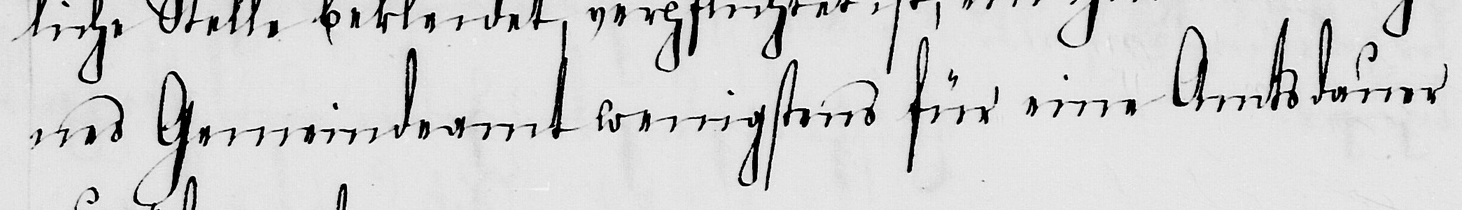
nes Gemeindeamt wenigstens für eine Amtsdauer
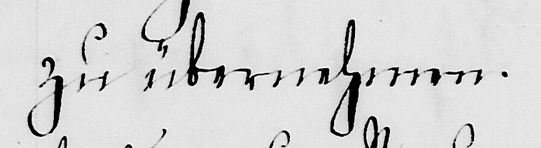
zu übernehmen.
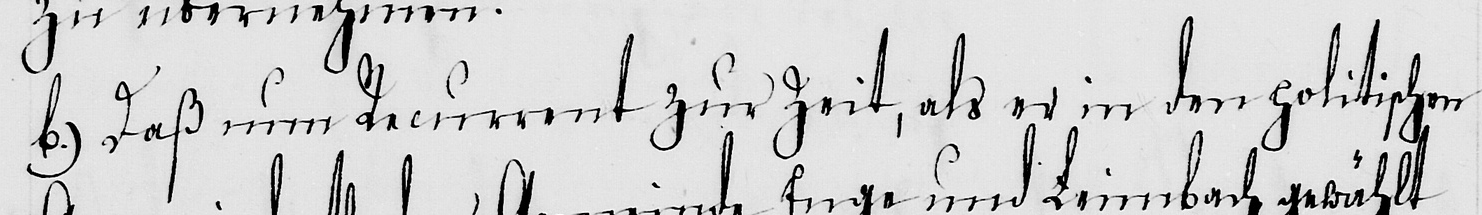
b.) Daß nun Recurrent zur Zeit, als er in den politischen
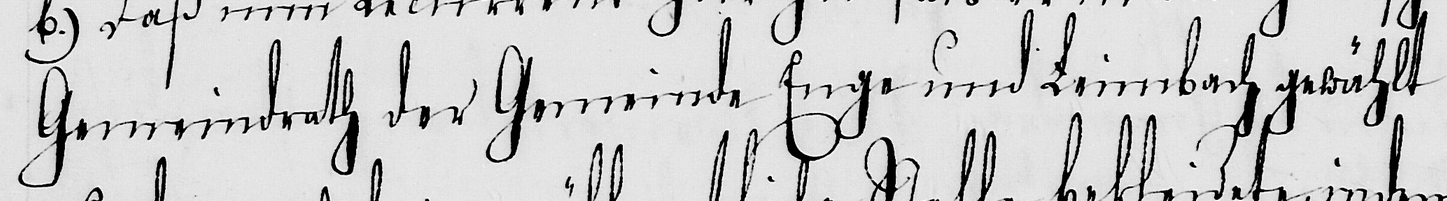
Gemeindrath der Gemeinde Enge und Leimbach gewählt
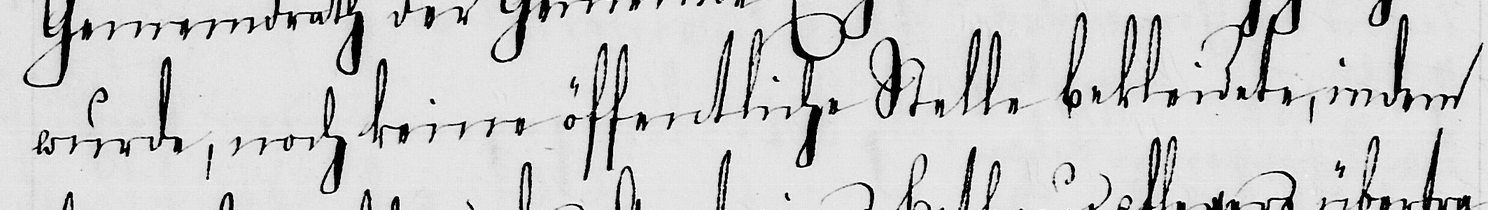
wurde, noch keine öffentliche Stelle bekleidete, indem
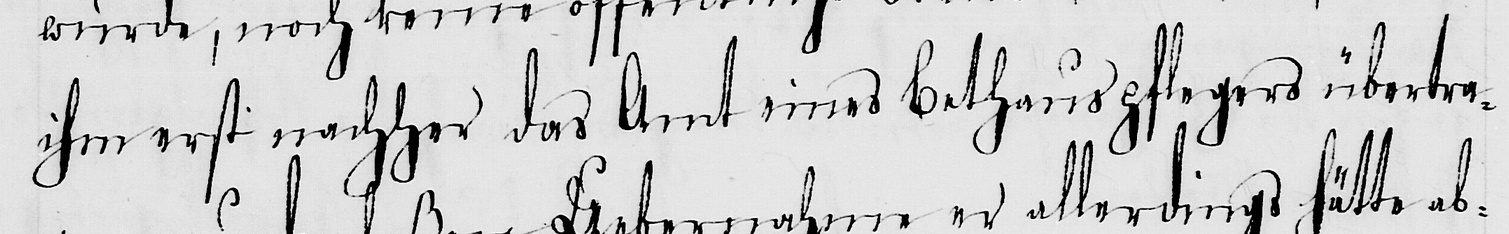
ihm erst nachher das Amt eines Bethauspflegers übertra¬
